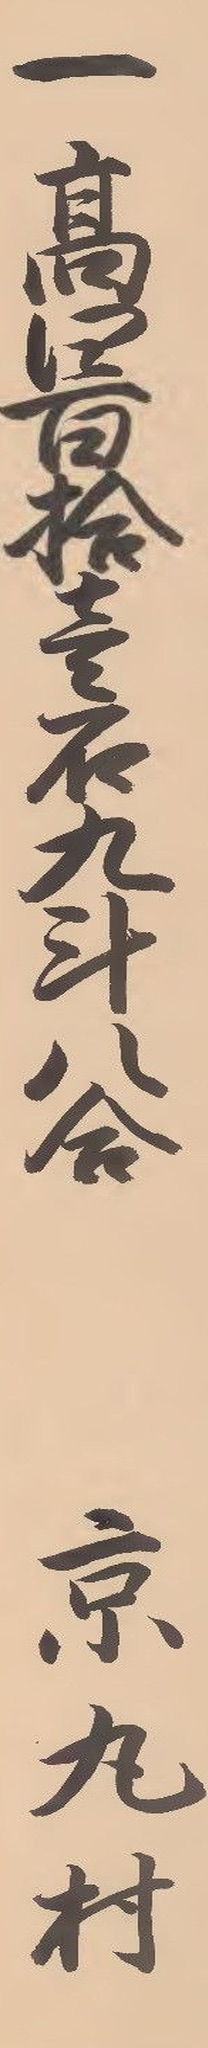一高四百拾壱石九斗八合京丸村
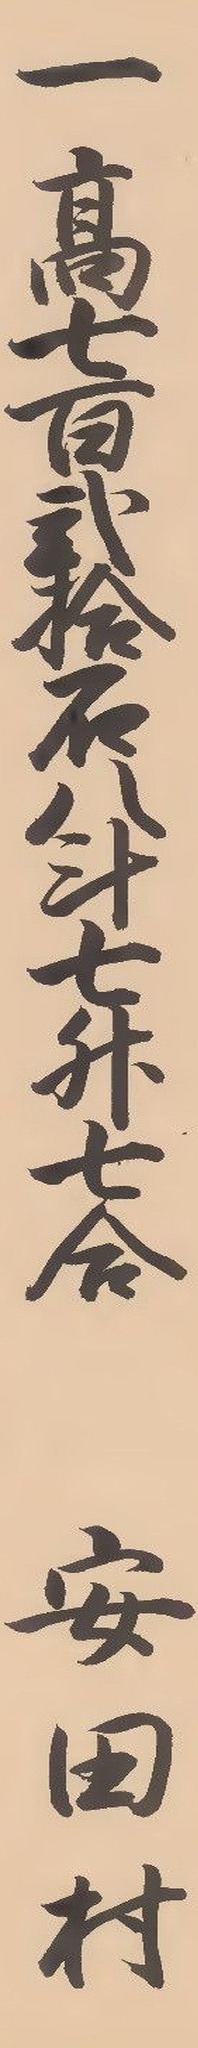一高七百弐拾石八斗七升七合安田村
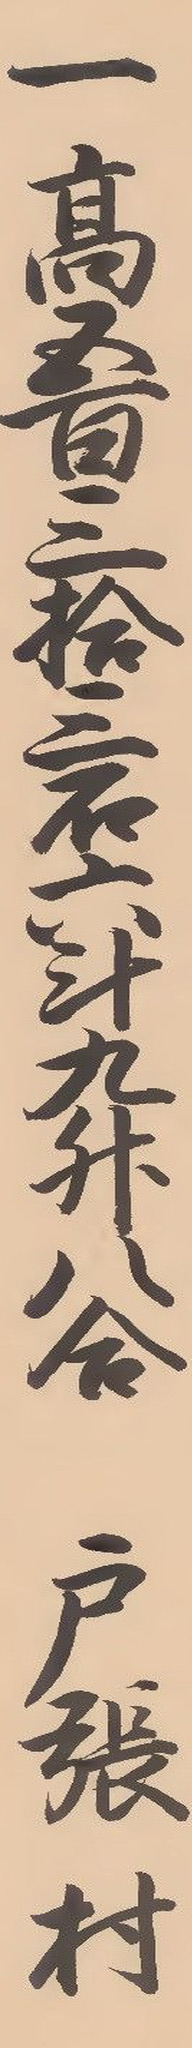一高五百三拾三石六斗九升八合戸張村
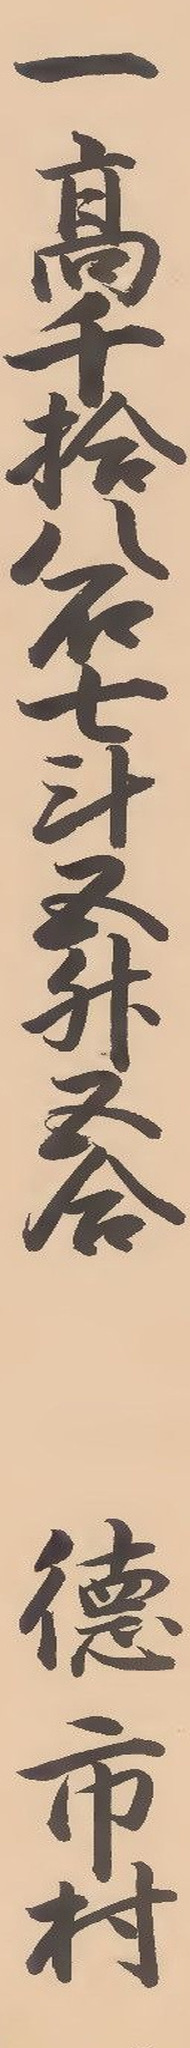一高千拾八石七斗五升五合徳市村

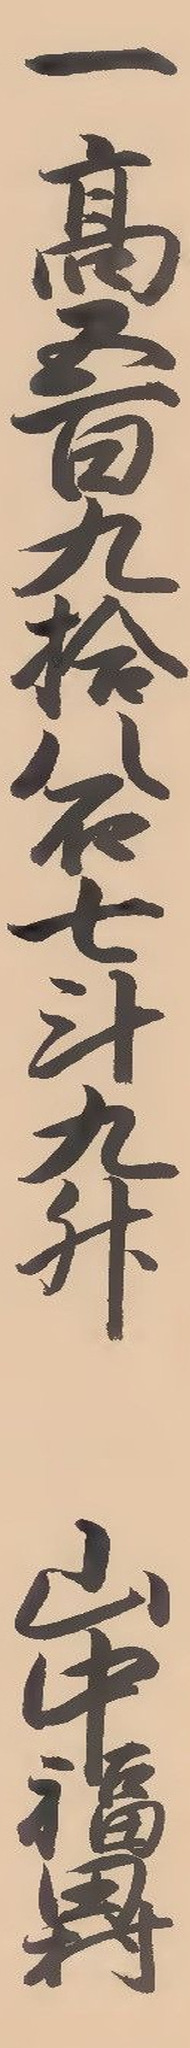一高五百九拾八石七斗九升山中福田村
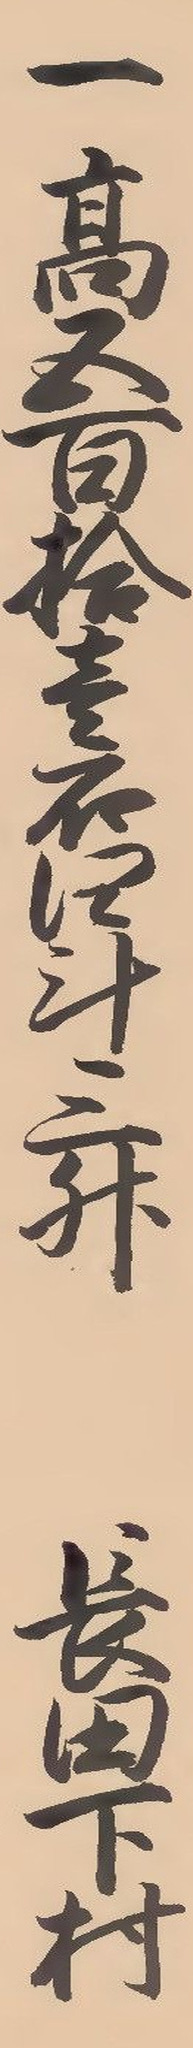一高五百拾壱石四斗三升長田下村
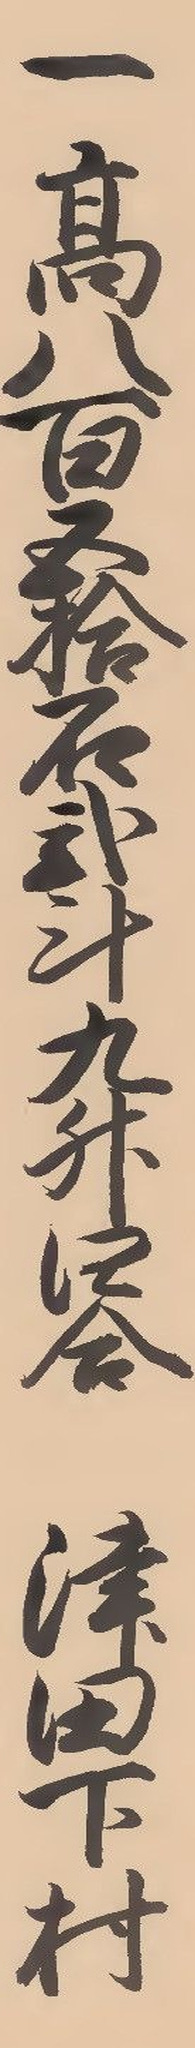一高八百五拾石弐斗九升四合津田下村
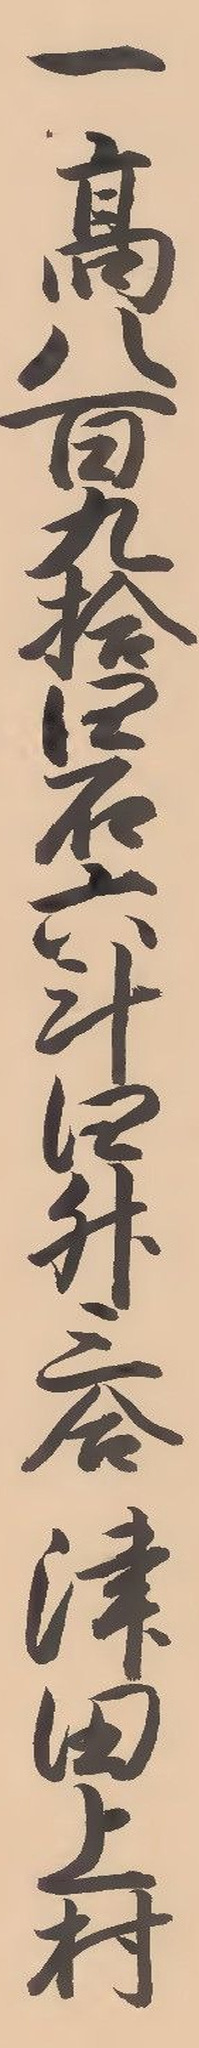一高八百九拾四石六斗四升三合津田上村
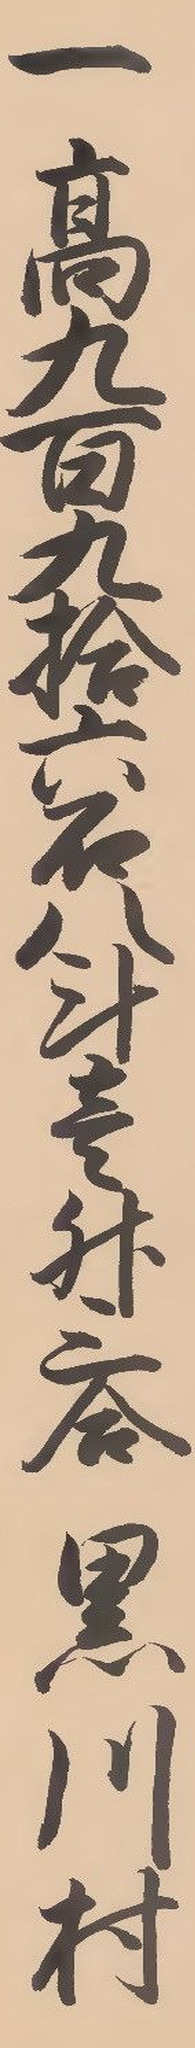一高九百九拾六石八斗壱升三合黒川村
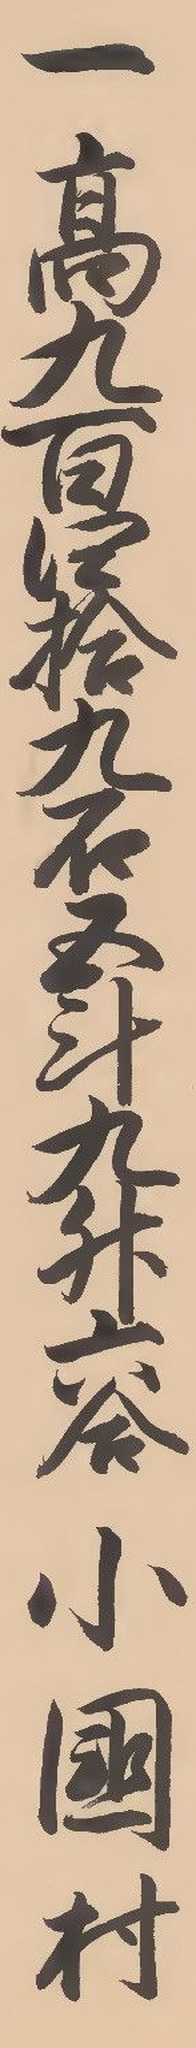一高九百四拾九石五斗九升六合小国村
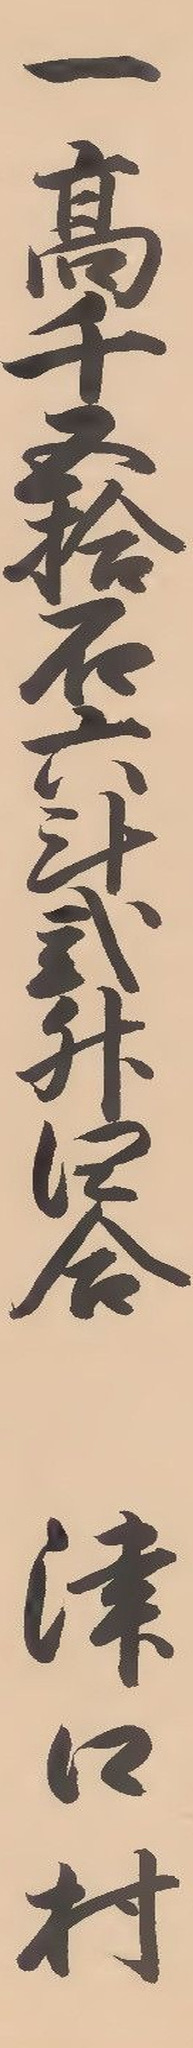一高千五拾石六斗弐升四合津口村
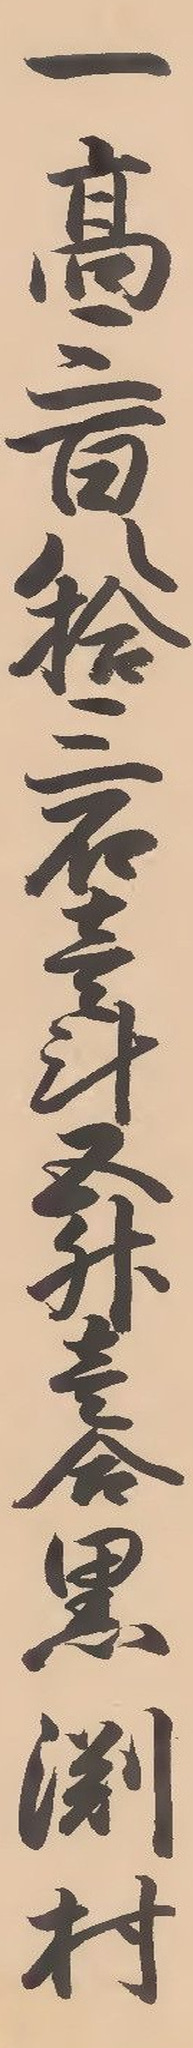一高三百八拾三石壱斗五升壱合黒渕村

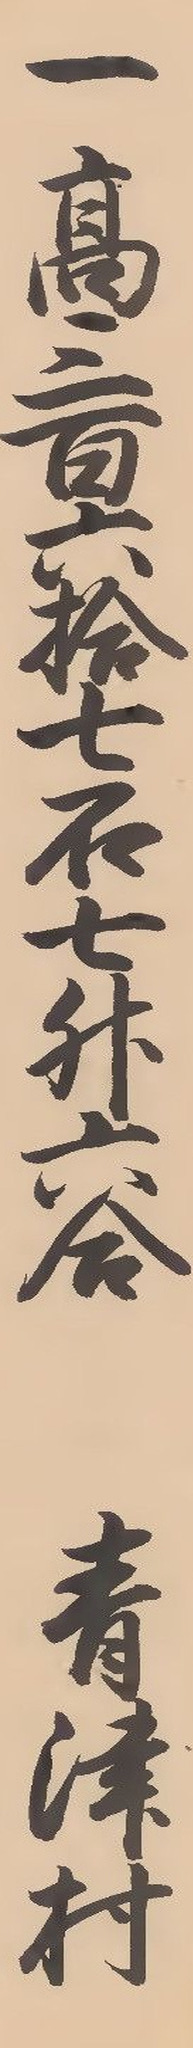一高三百六拾七石七升六合青津村
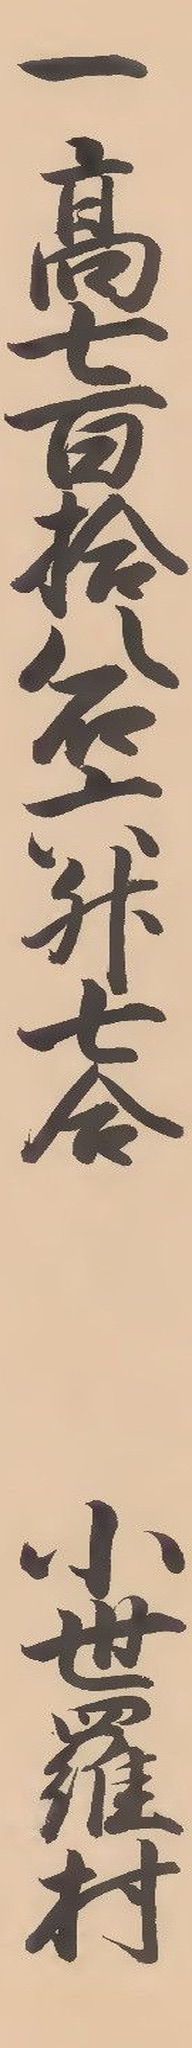一高七百拾八石六升七合小世羅村
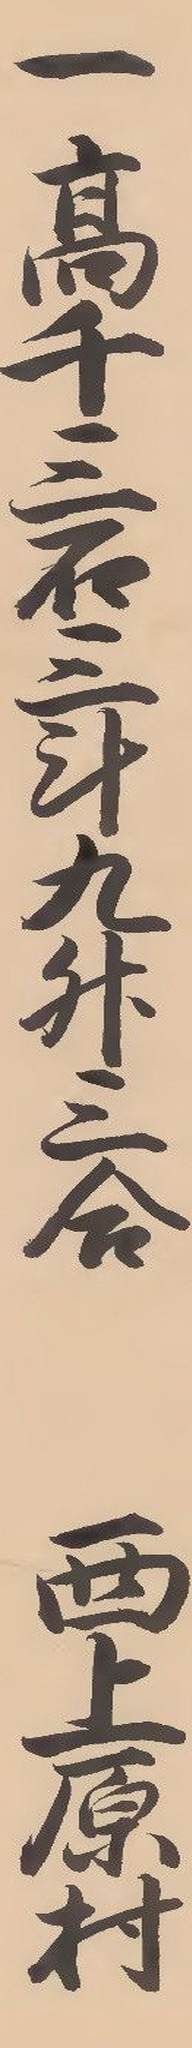一高千三石三斗九升三合西上原村
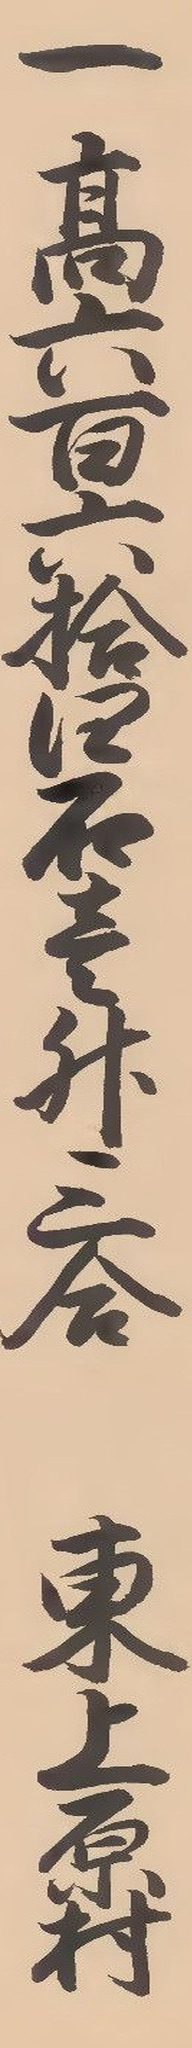一高六百六拾四石壱升三合東上原村
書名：備後国郷帳
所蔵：国立公文書館 National Archives of Japan
